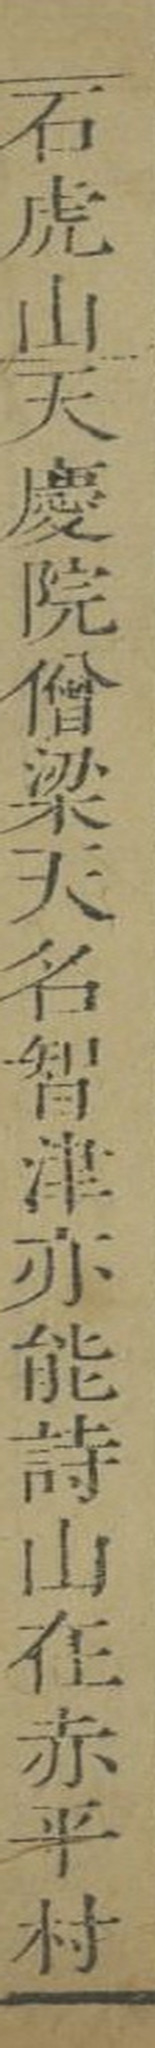[石虎山]天慶院僧梁天名智津亦能詩山在赤平村
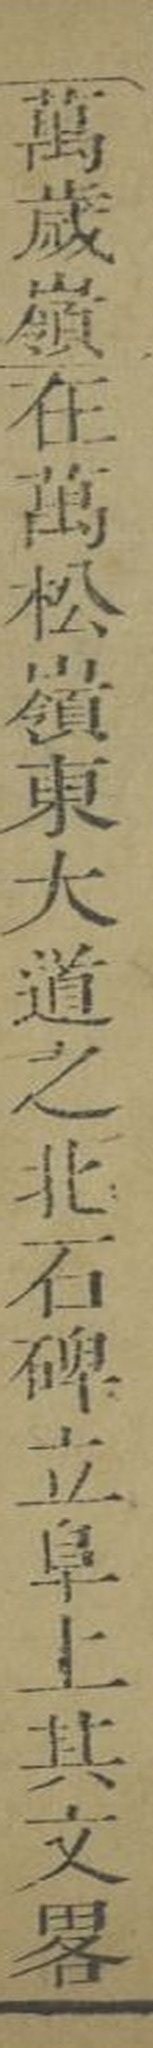[万歳嶺]在万松嶺東大道之北石碑立阜上其文略
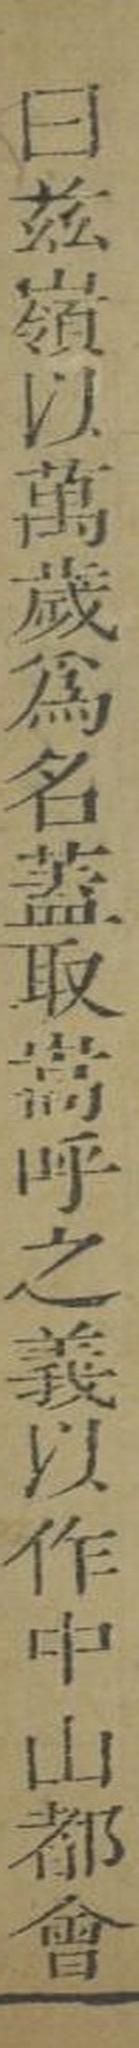曰茲嶺以万歳為名蓋取嵩呼之義以作中山都会
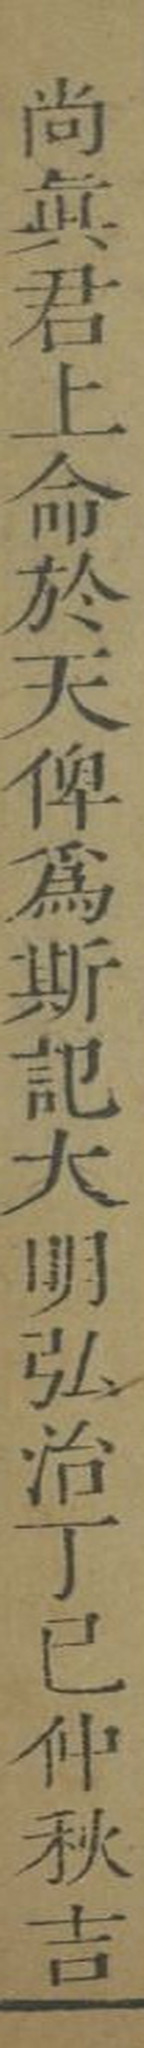尚真君上命於天俾為斯記大明弘治丁巳仲秋吉

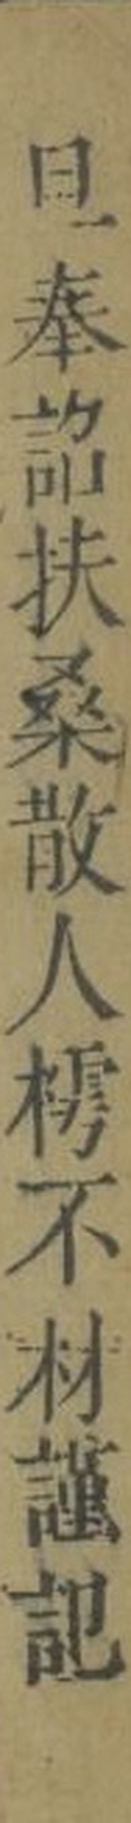旦奉詔扶桑散人樗不材謹記
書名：中山伝信録 巻四
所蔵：University of the Ryukyus Library
